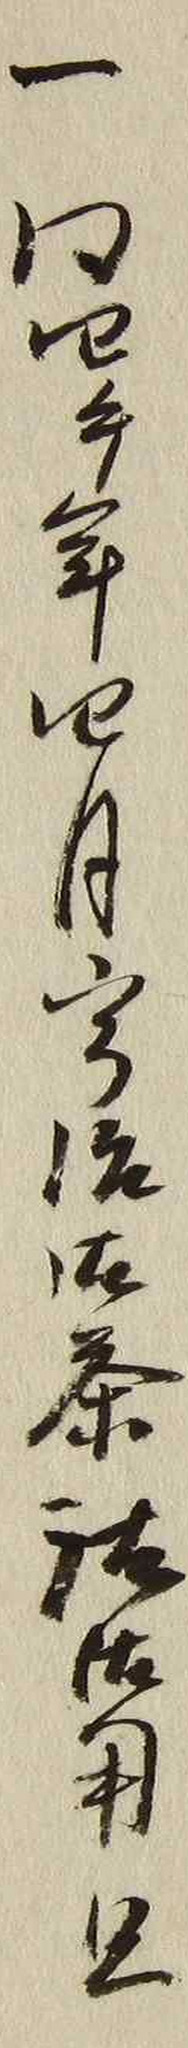一同四午年四月宇治御茶御用且
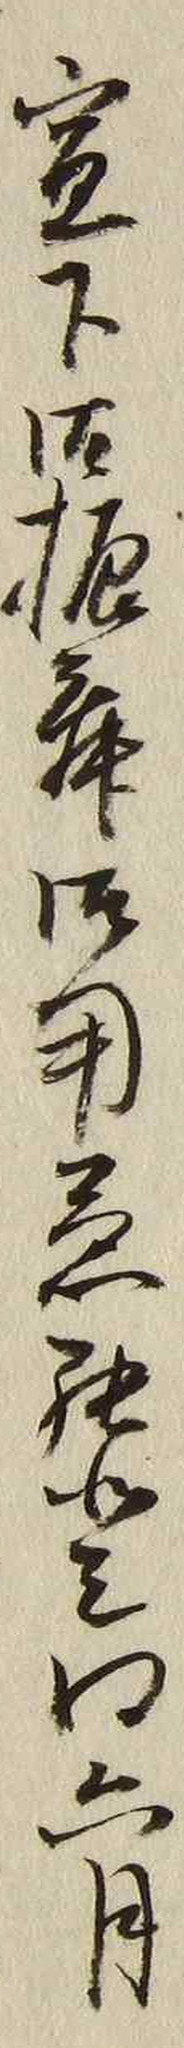宣下御振舞御用兼罷登同六月
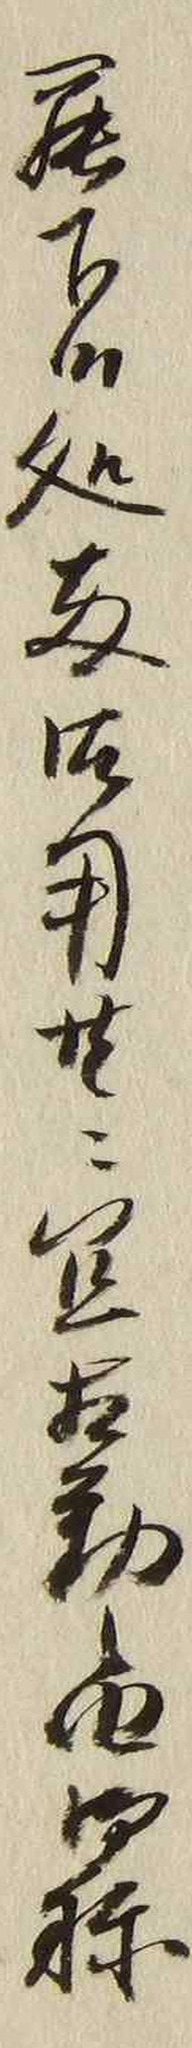罷下候処両御用共ニ宜相勤候由御称
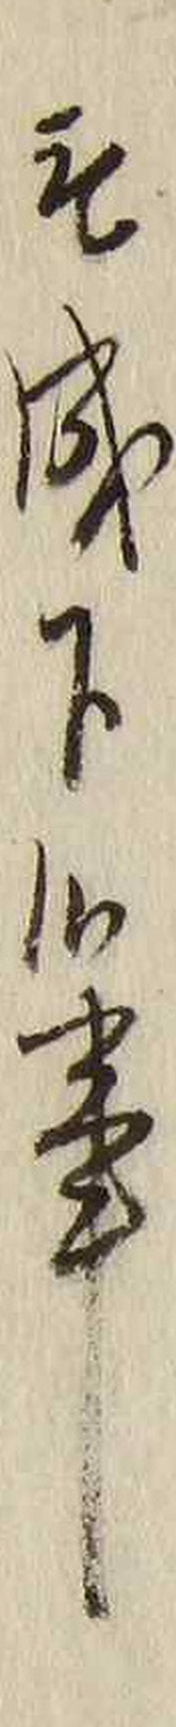被成下候事

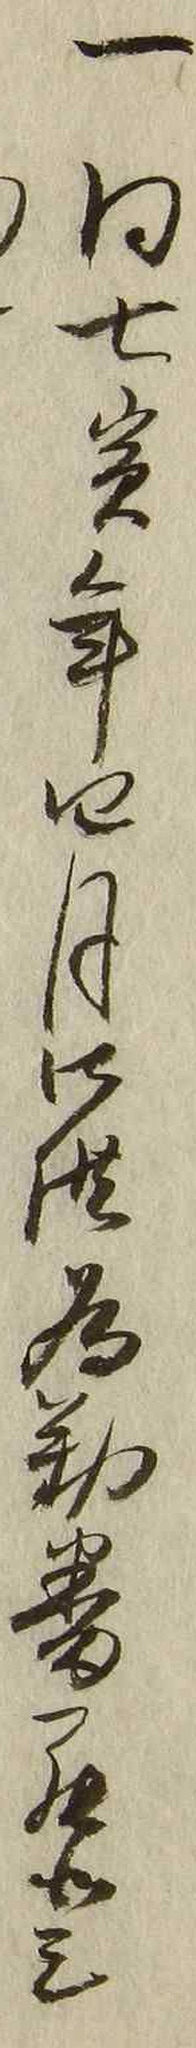一同七寅年四月御供為勤番罷登
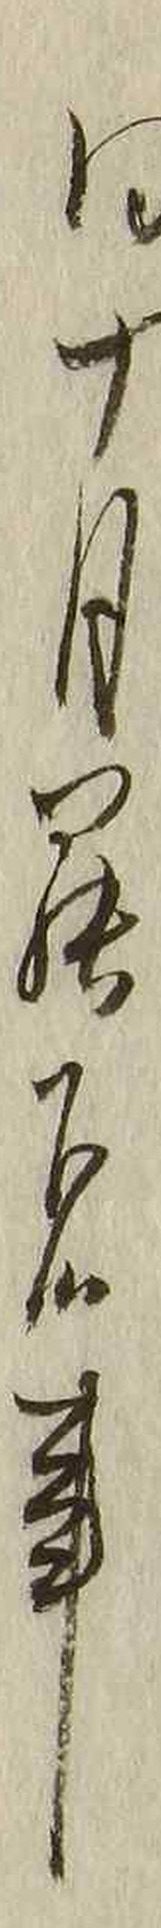同十月罷下候事
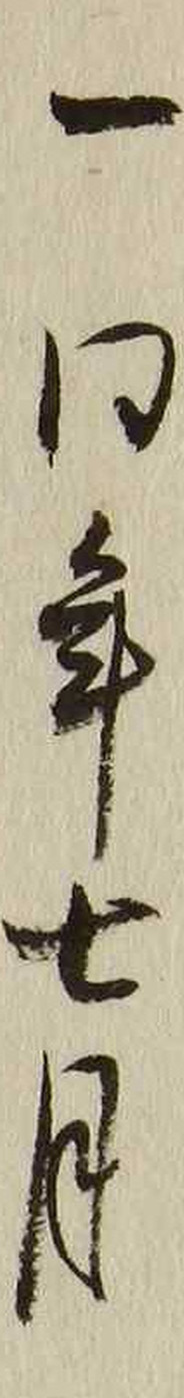一同年七月
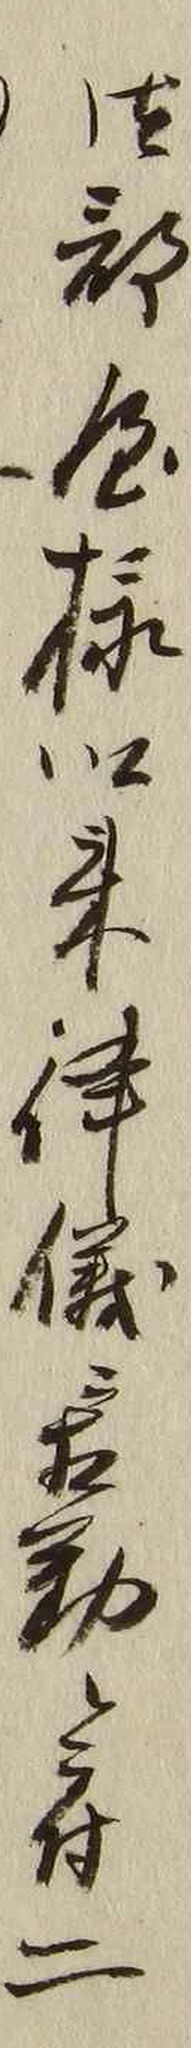御部屋様以来律儀ニ相勤候ニ付二
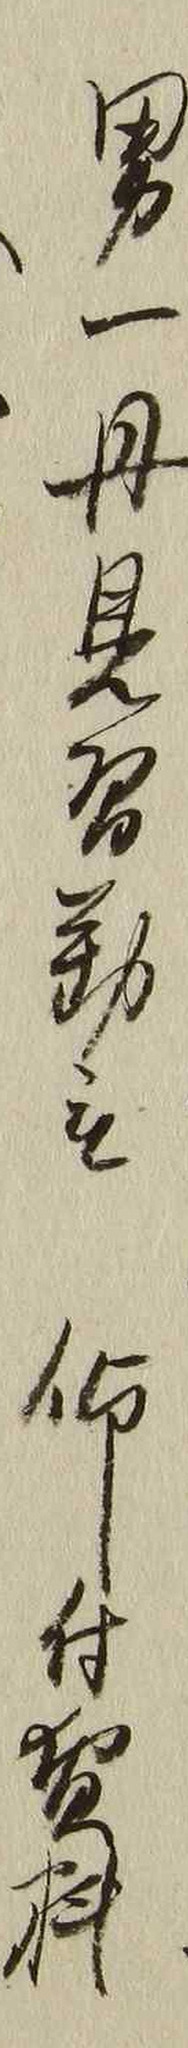男一丹見習勤被仰付費料
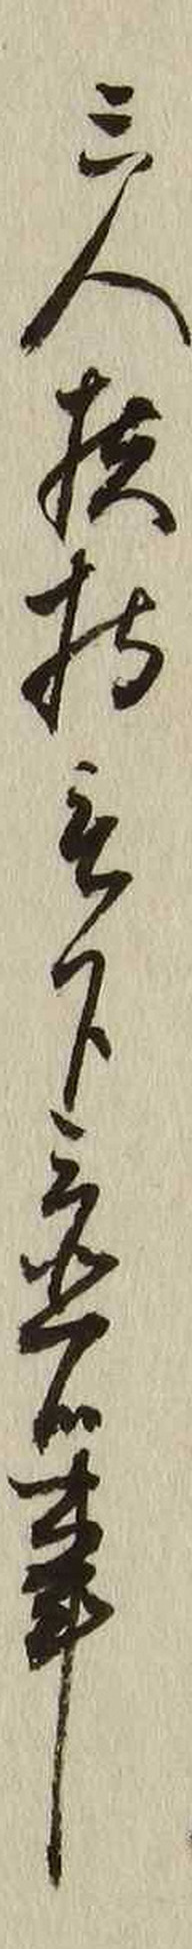三人扶持被下置候事
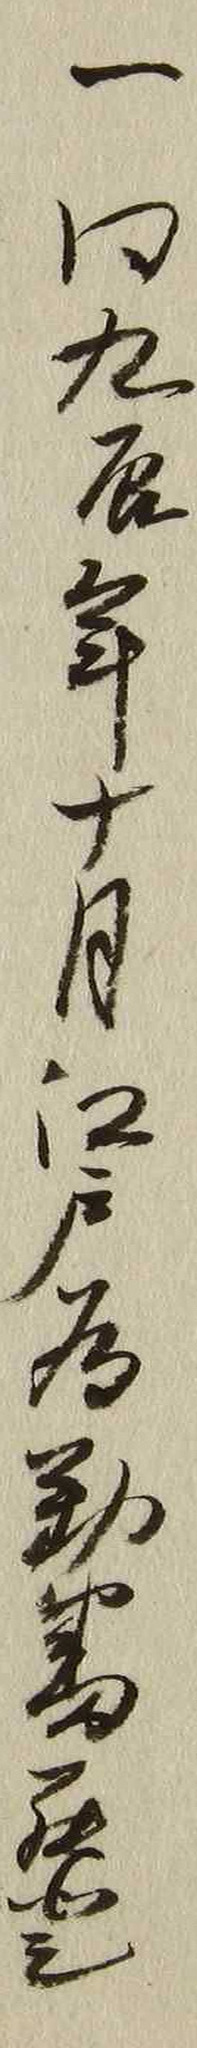一同九辰年十月江戸為勤番罷登
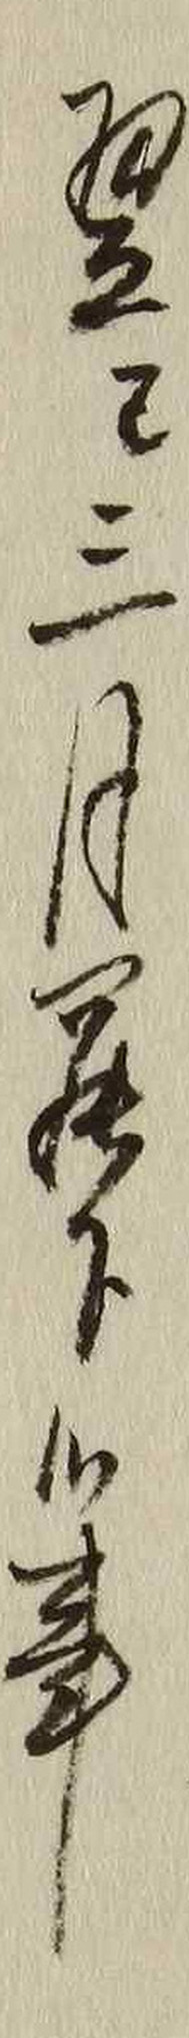翌巳三月罷下候事
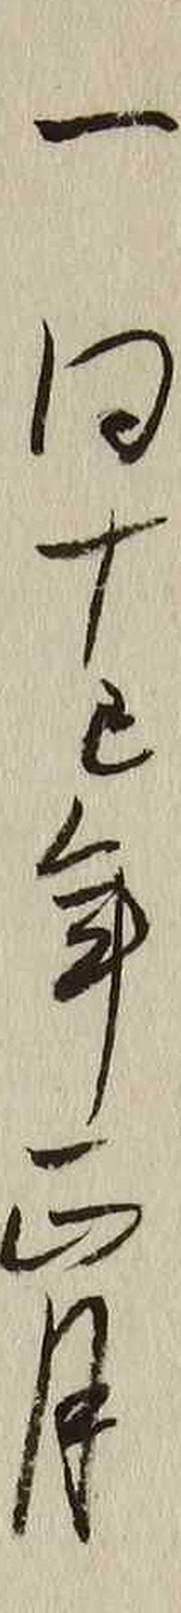一同十巳年正月
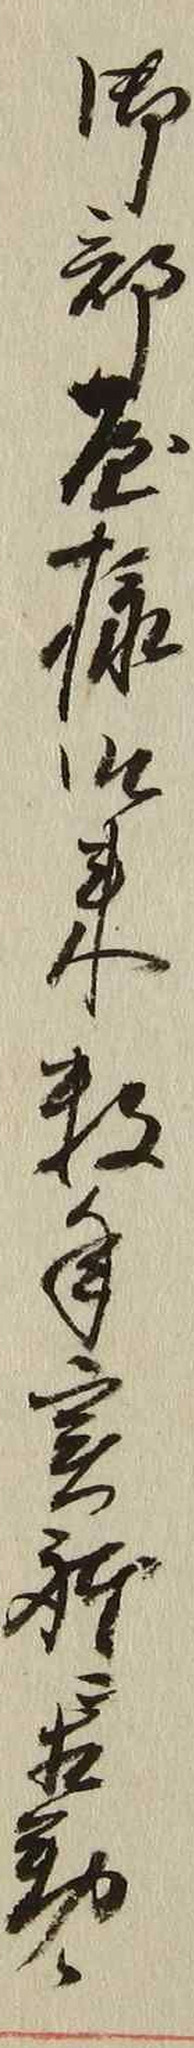御部屋様以来数年実体ニ相勤候
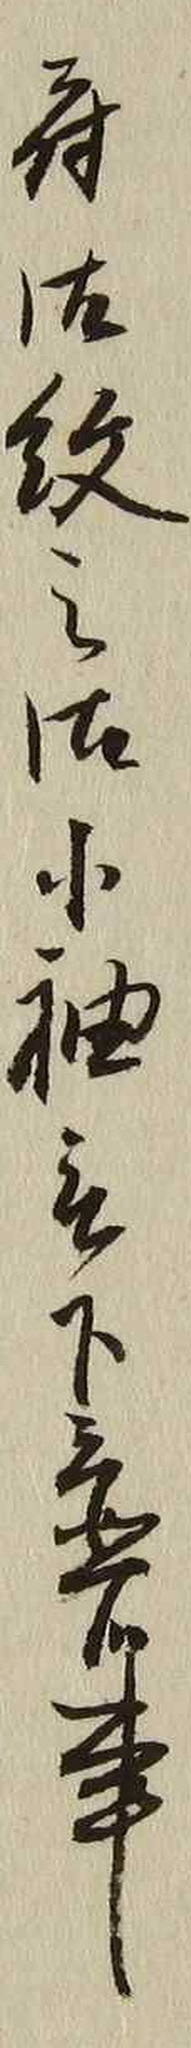ニ付御紋之御小袖被下置候事
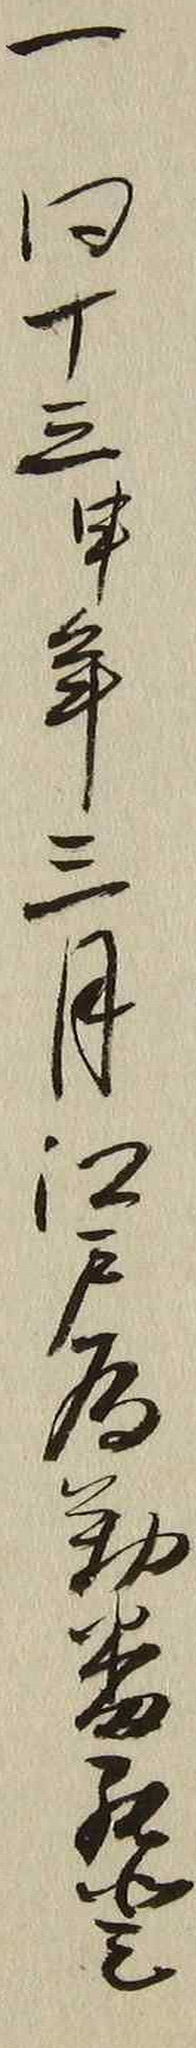一同十三申年三月江戸為勤番罷登
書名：諸士系譜　巻之349　も之部5
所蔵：会津若松市立会津図書館
